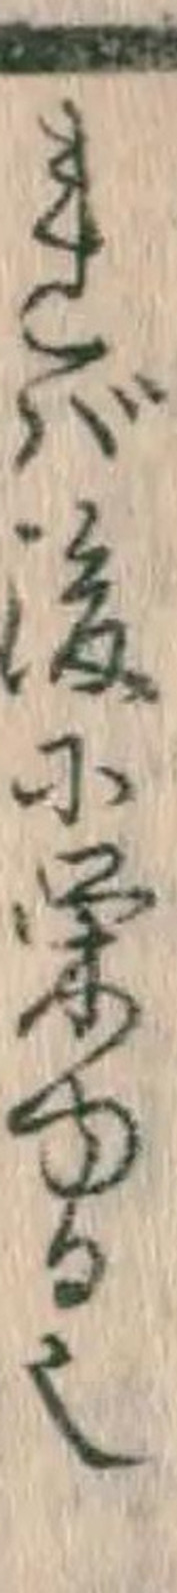れば後に栄ゆる也
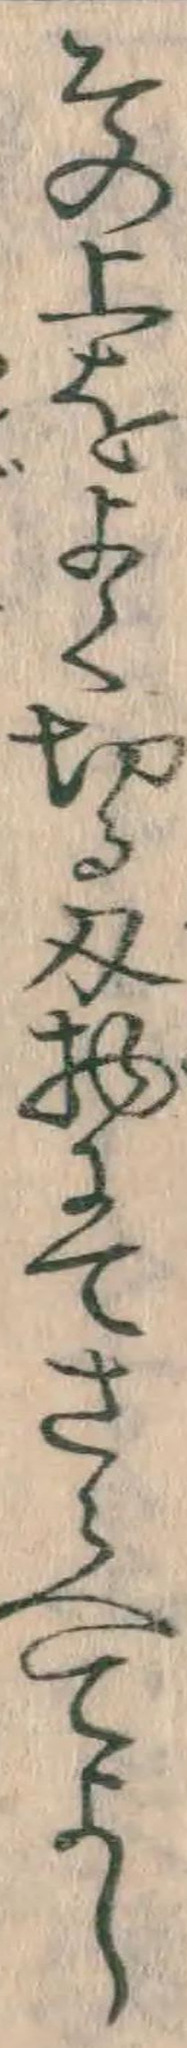その上をよく切る刃物にてさらへてよし
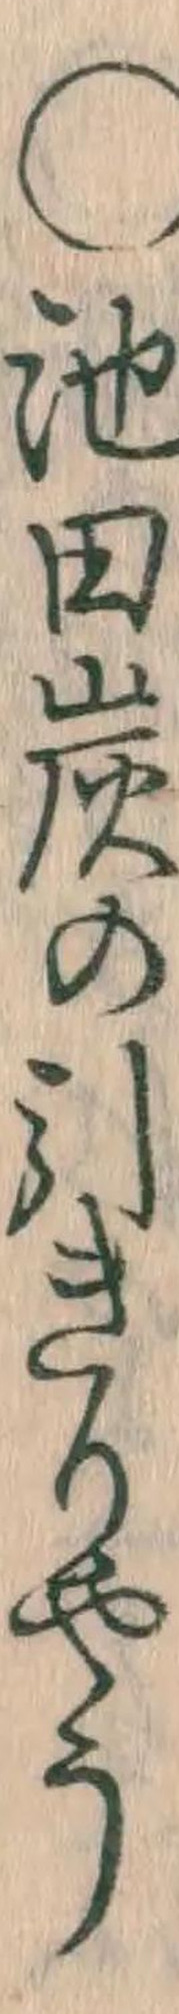○池田炭の引きりやう
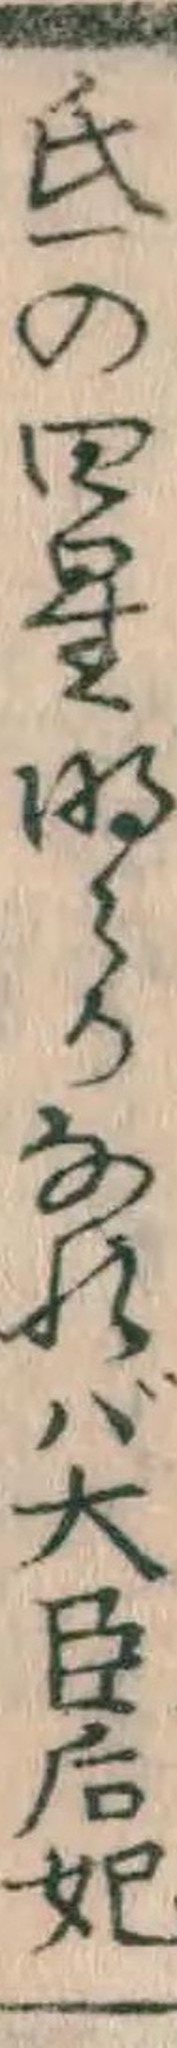氐の四星明らかなれば大臣后妃
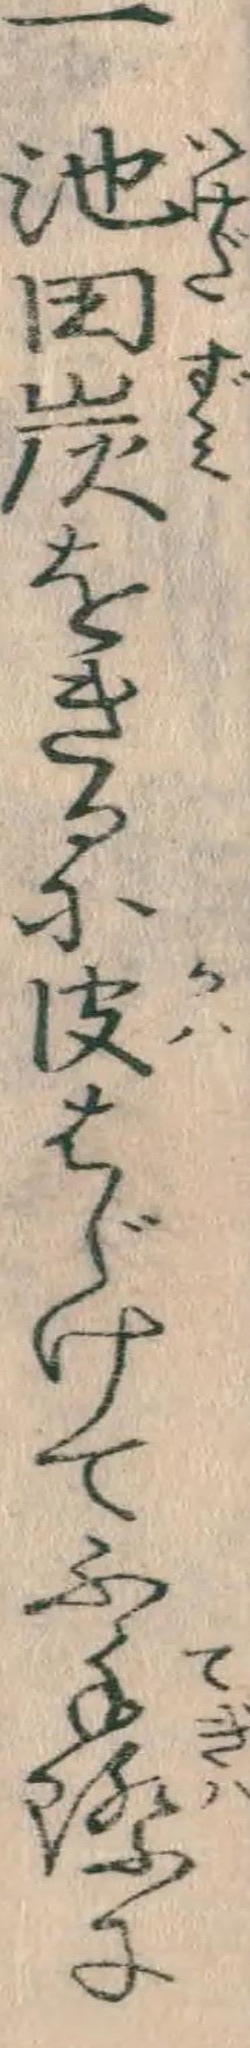一池田炭をきるに皮はじけて不手際に
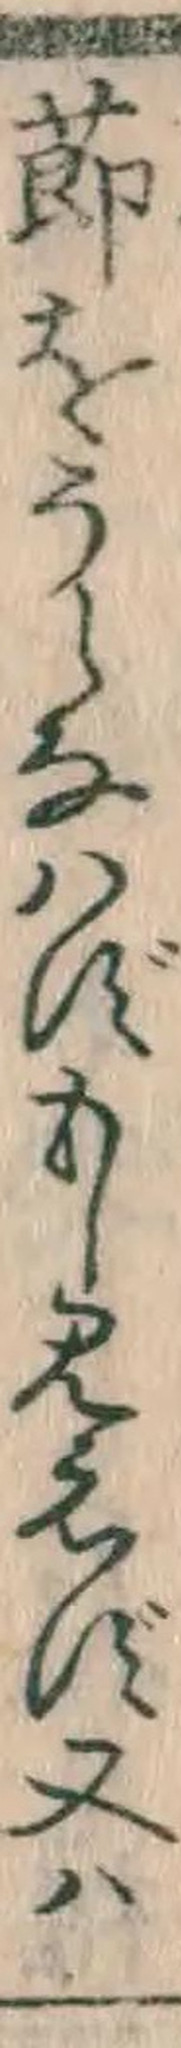節をうしなはずもし見えず又は
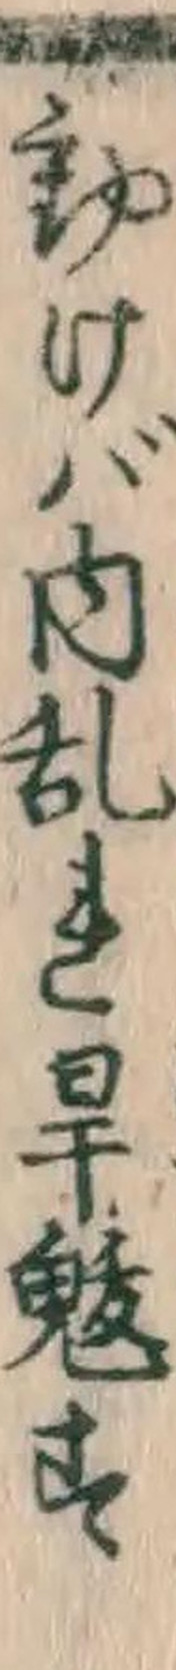動けば内乱れ旱魃す
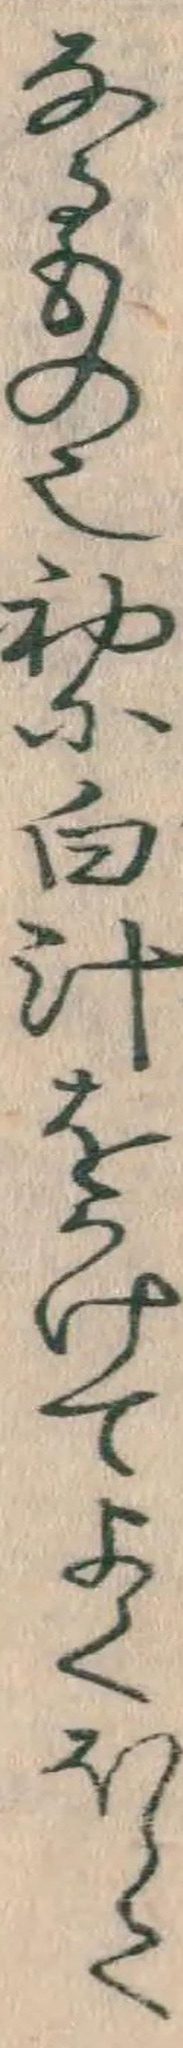なるもの也初に白汁をかけてよくほして
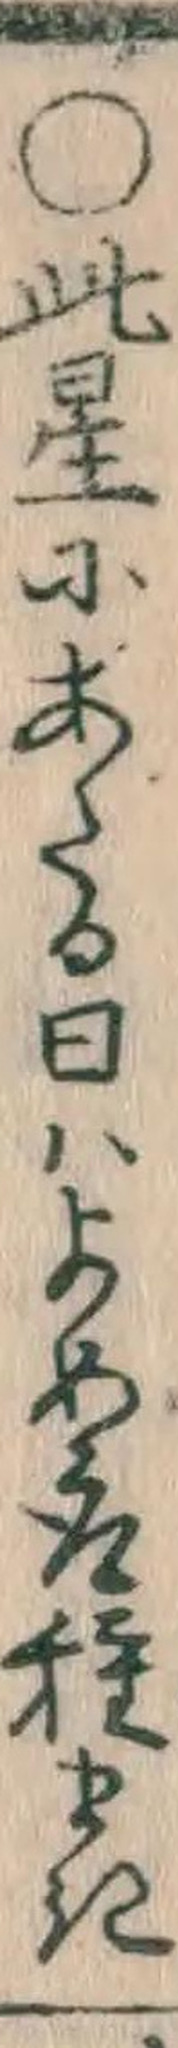○此星にあたる日はよめ取種まき
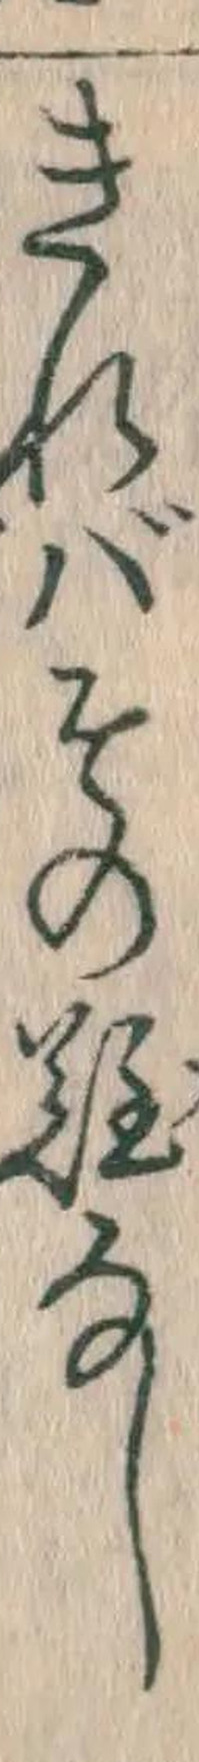きればその難なし
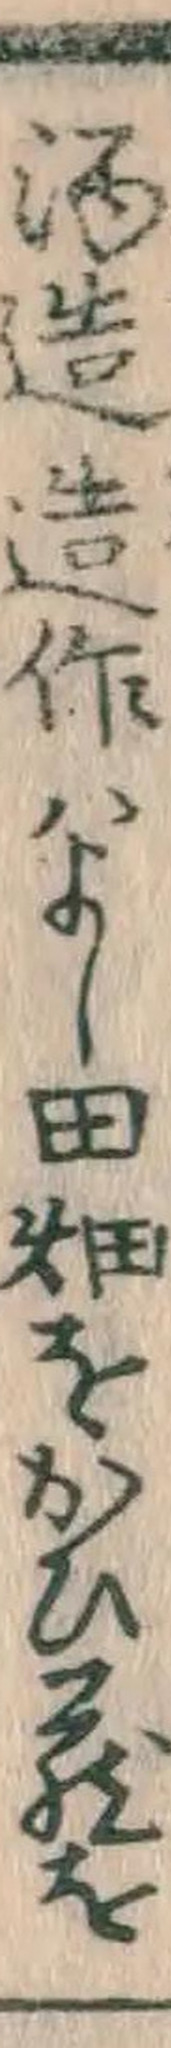酒造造作はよし田畑をかひ蔵を
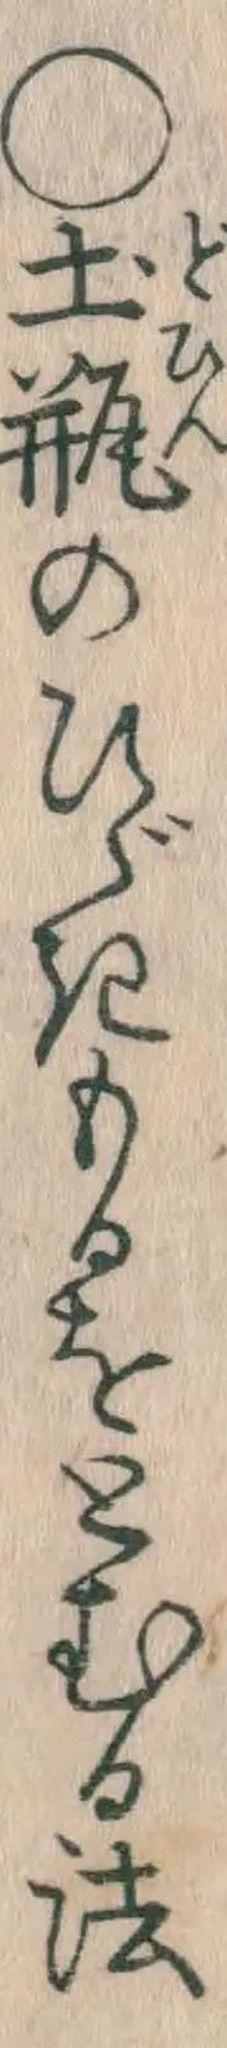○土瓶のひゞきもるをとむる法
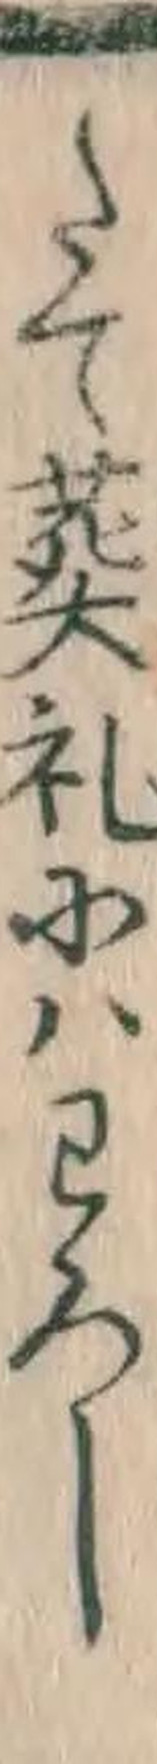たて葬礼にはわろし
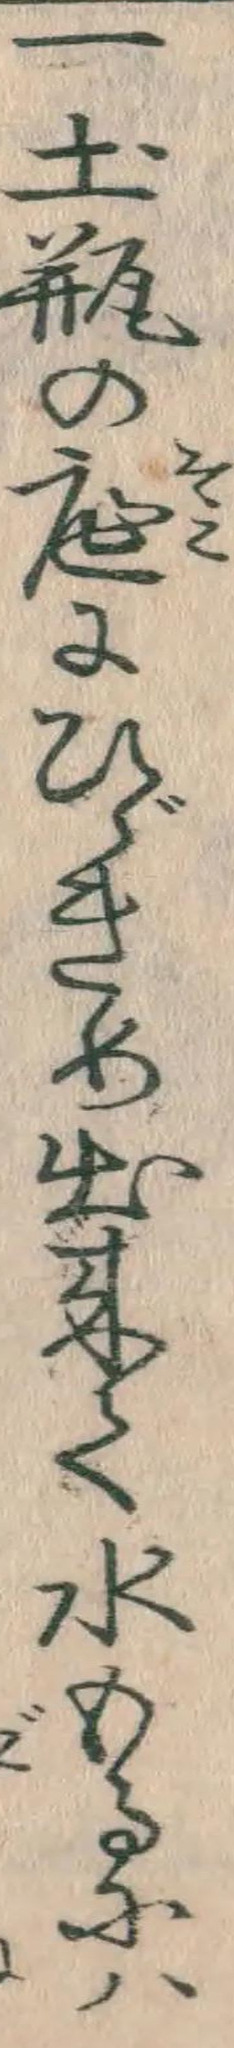一土瓶の底にひゞきめ出来て水もるには
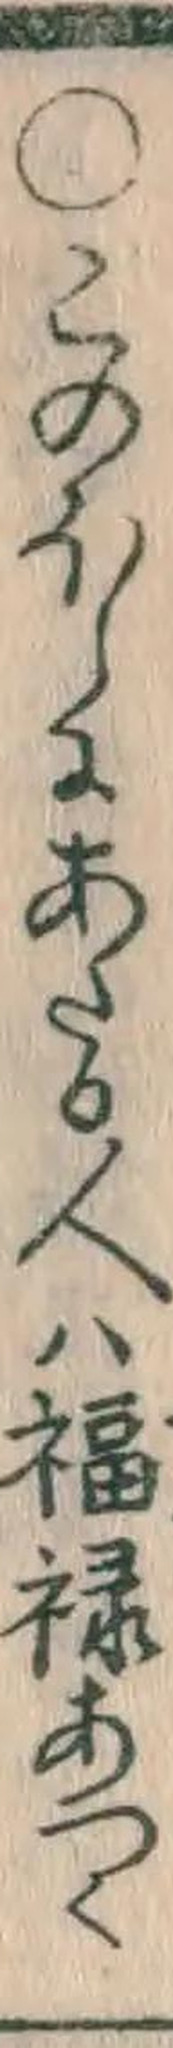○このほしにあたる人は福禄あつく
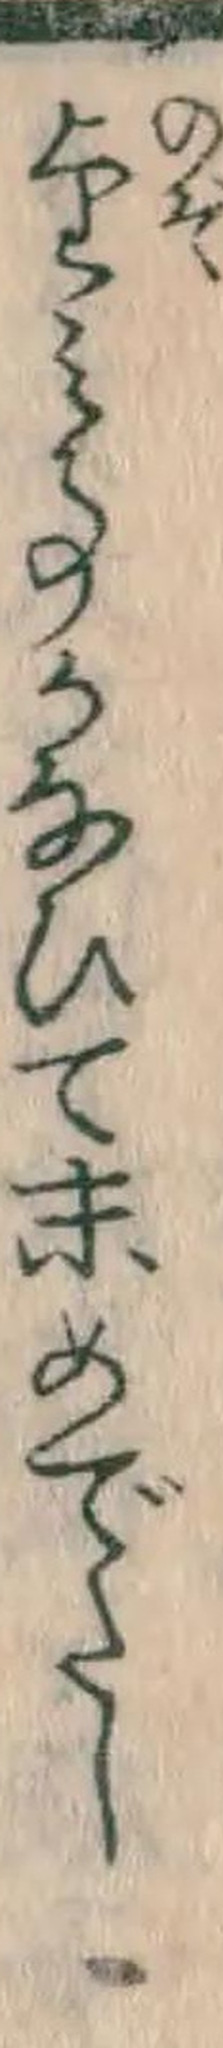望み事かなひて末めでたし
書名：広益秘事大全 3巻. [2]
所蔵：国立国会図書館 National Diet Library, JAPAN
